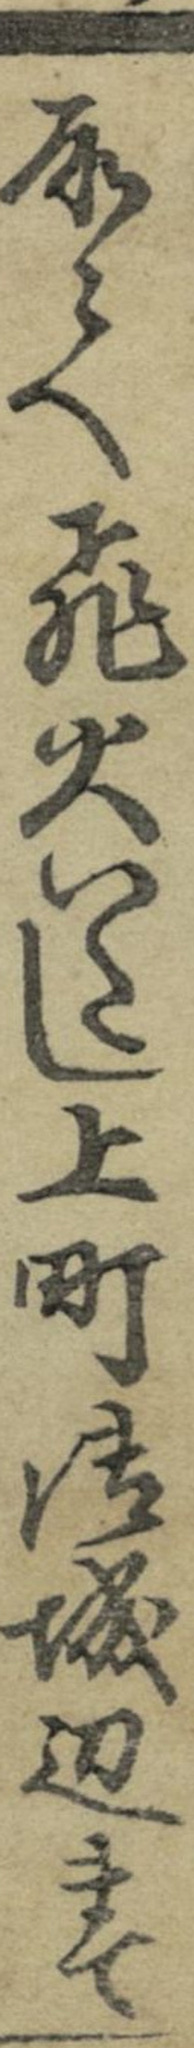所々へ飛火いたし上町御城辺まて
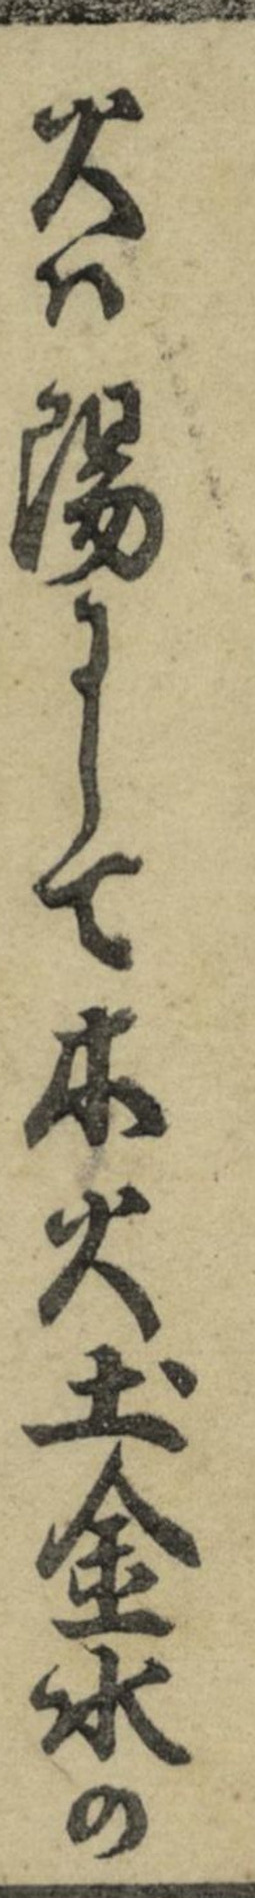火は陽にして木火土金水の
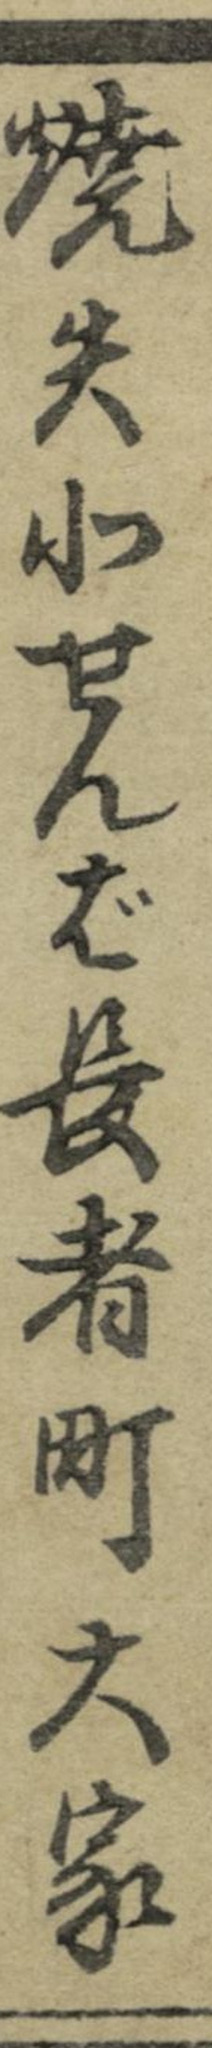焼失北せんば長者町大家
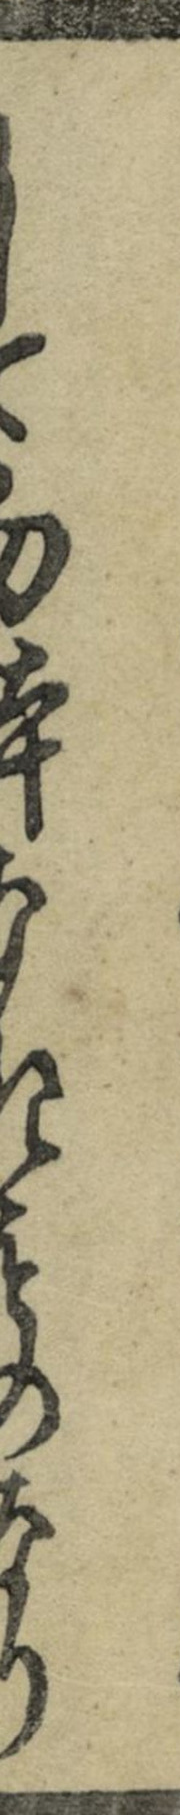にして勿体なきものなり
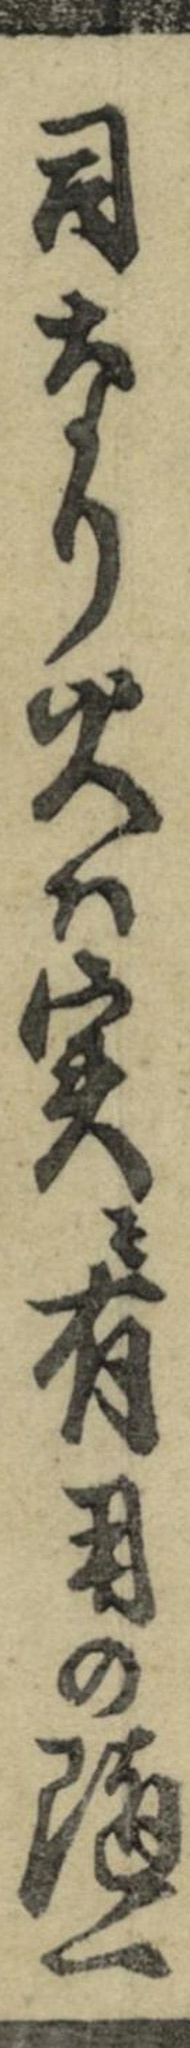司なり火は実に有用の随一
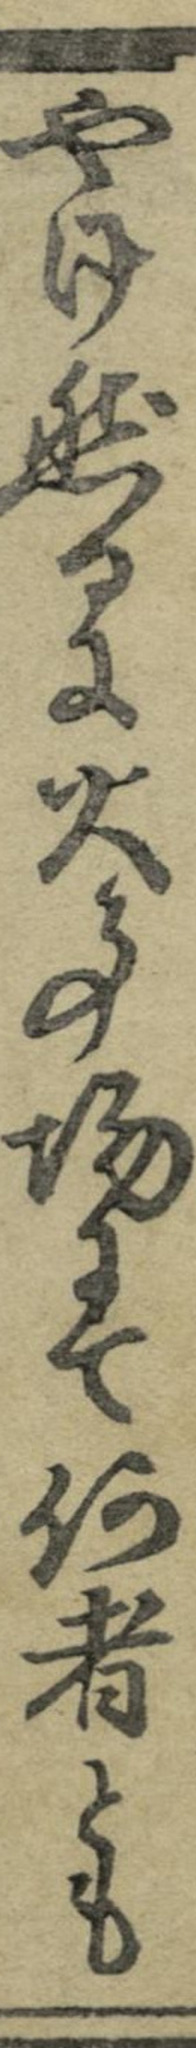やけ然るに火事場にて何者とも
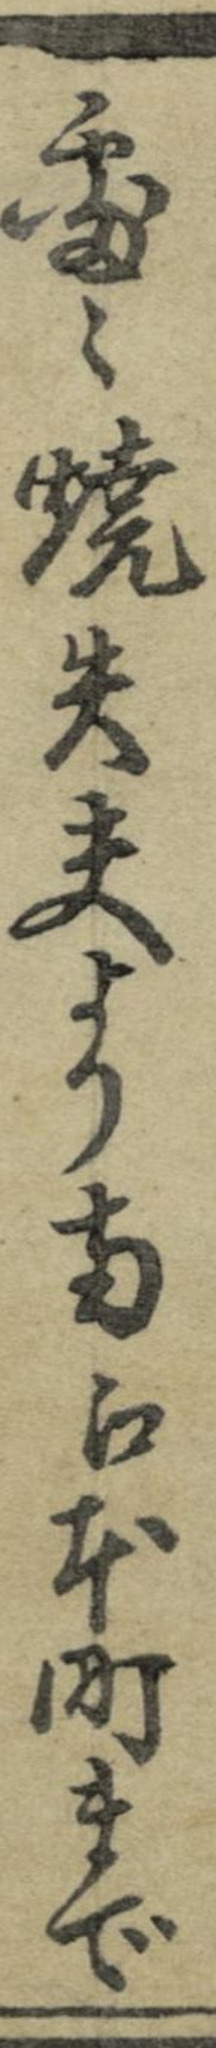処？々消失夫より南へ本町まで
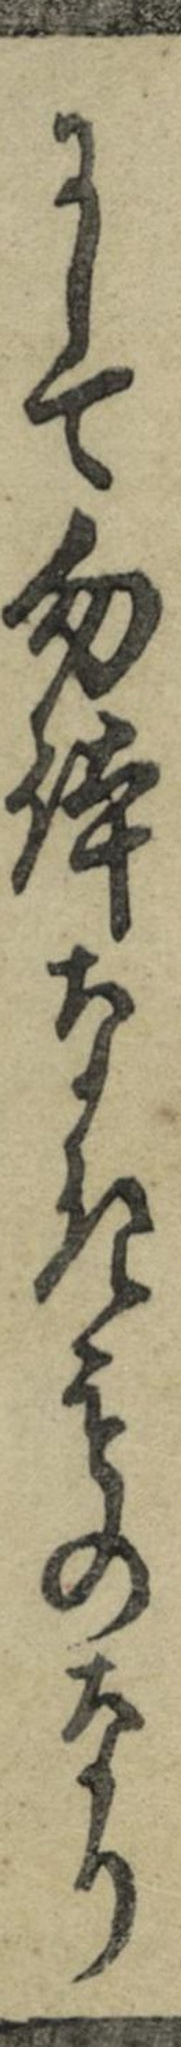にして勿体なきものなり
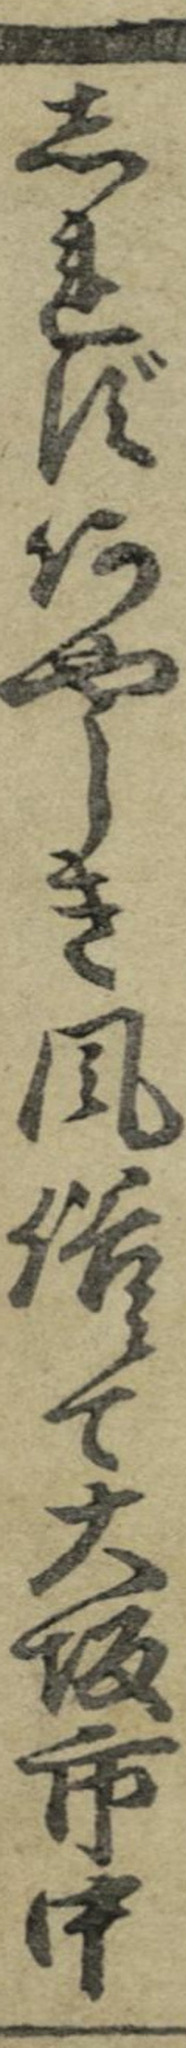しれずあやしき風俗にて大坂市中
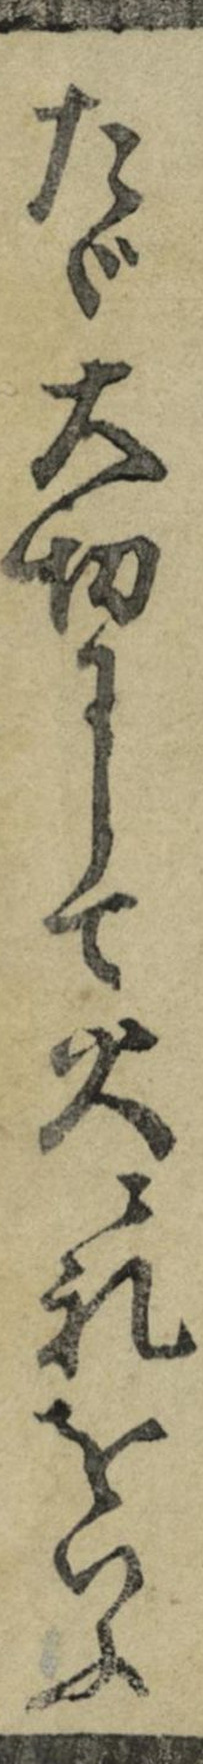たゞ大切にして火に礼をいふ
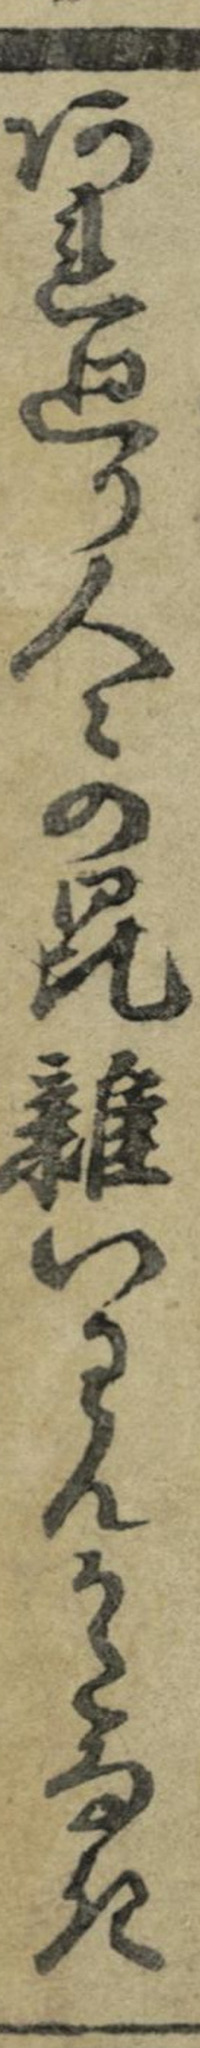あれ廻り人々の混雑いわんかたなき
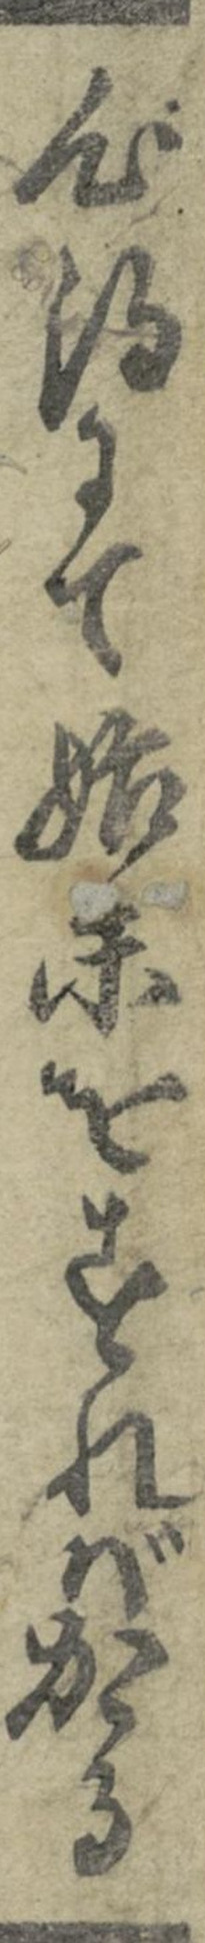心得にて始末をすればかゝる
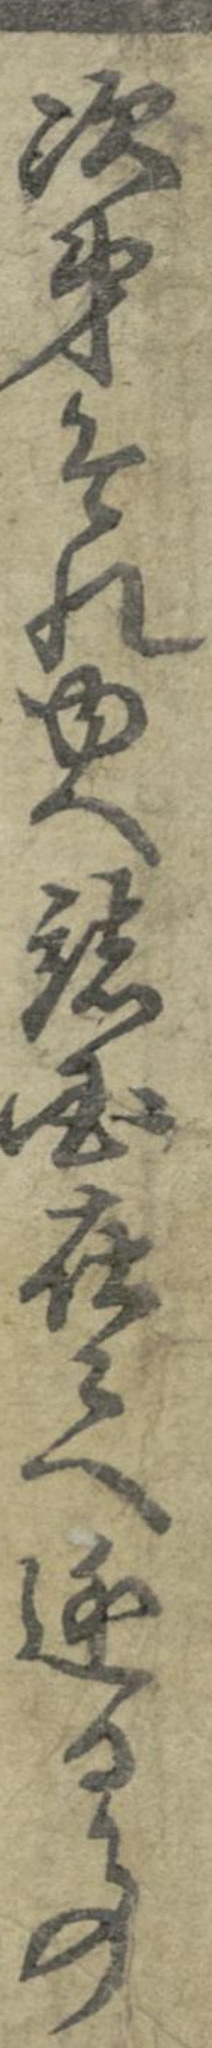次第それゆへ諸国在々へ逃る事
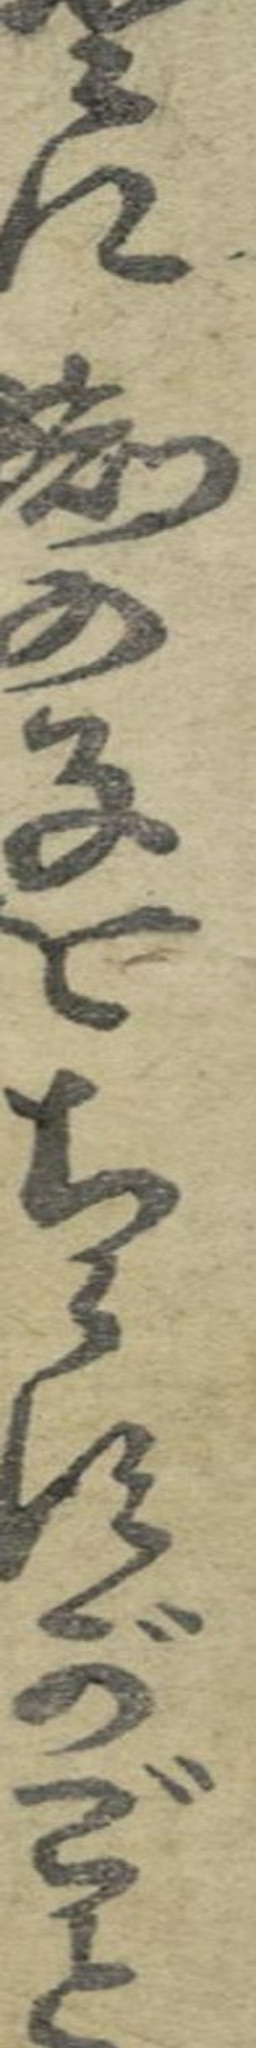実？に蜘の子をちらすがごとく
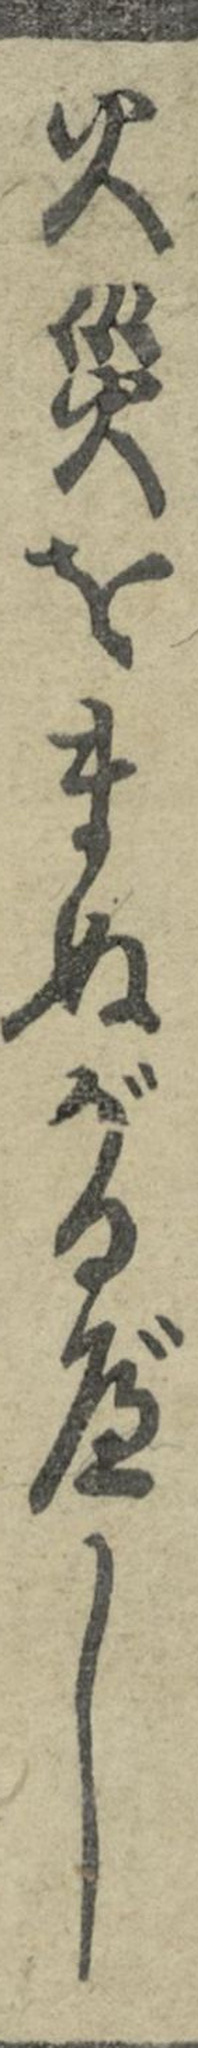火災をまぬがるべし
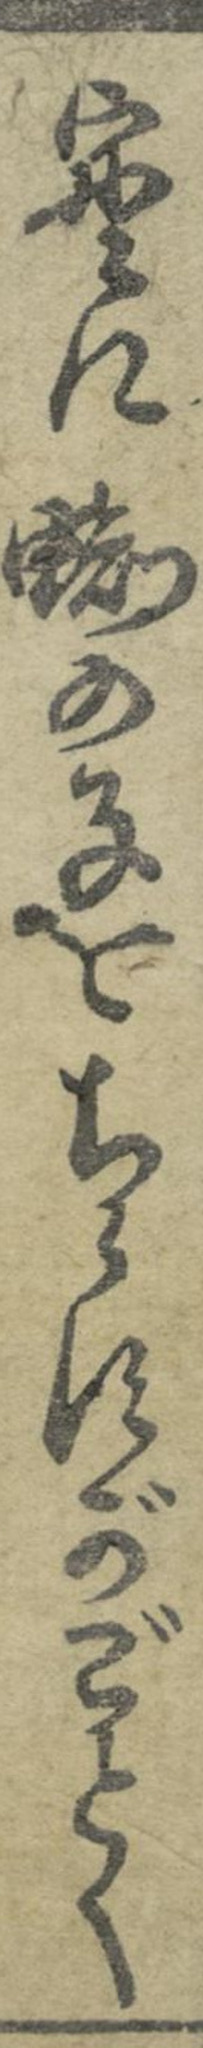実？に蜘の子をちらすがごとく
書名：大阪今昔三度の大火
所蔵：東京大学地震研究所図書室 Earthquake Research Institute Library, The University of Tokyo, JAPAN
